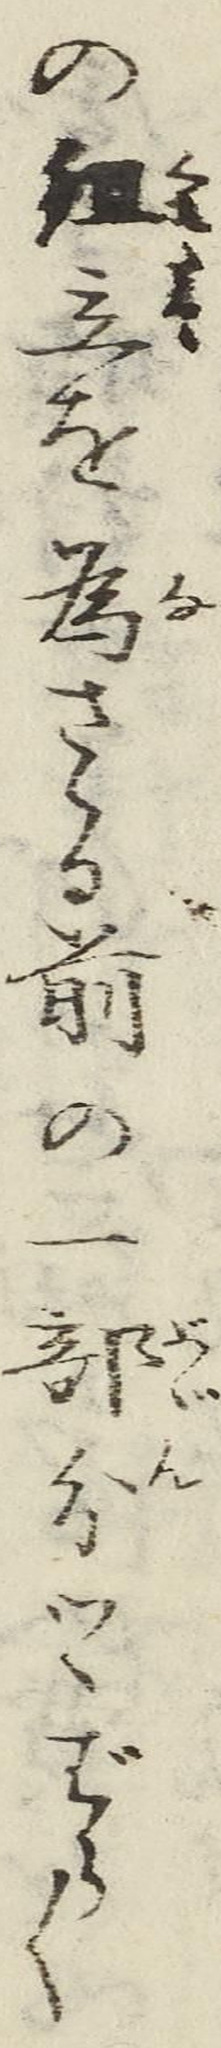の組立を為さゝる前の一部分ツヽばら〳〵
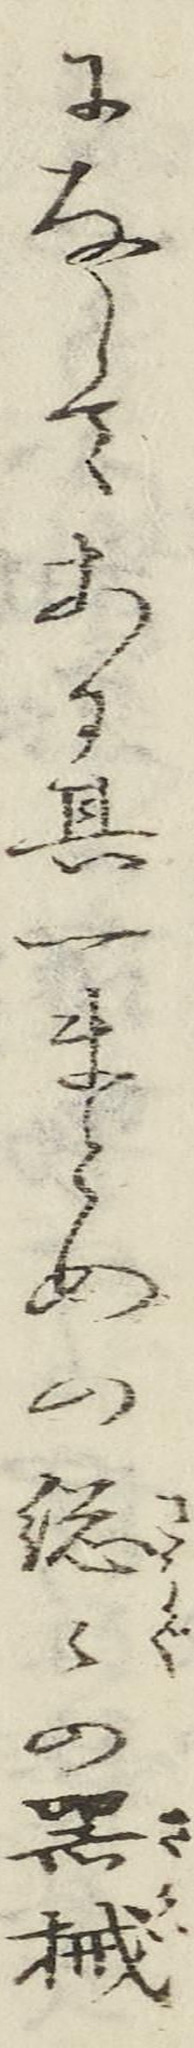になしてある其一まとめの総〻の器械
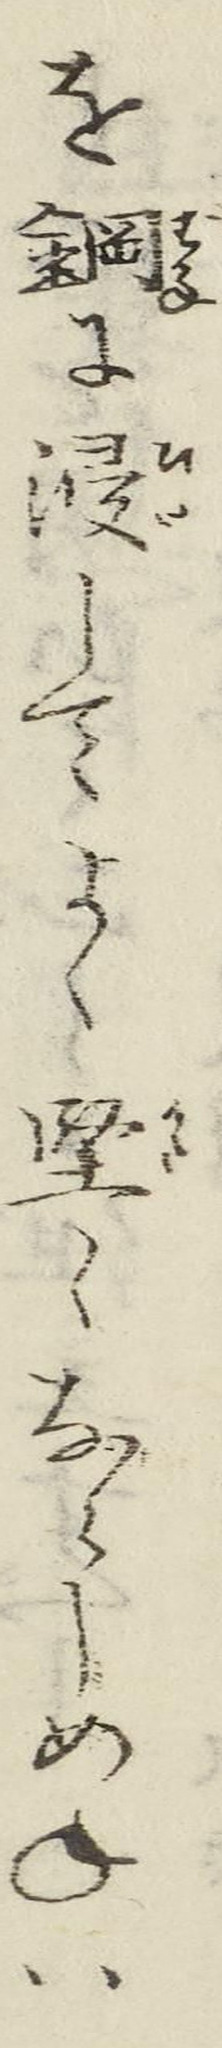を鋼に浸してよく堅くならしめねは
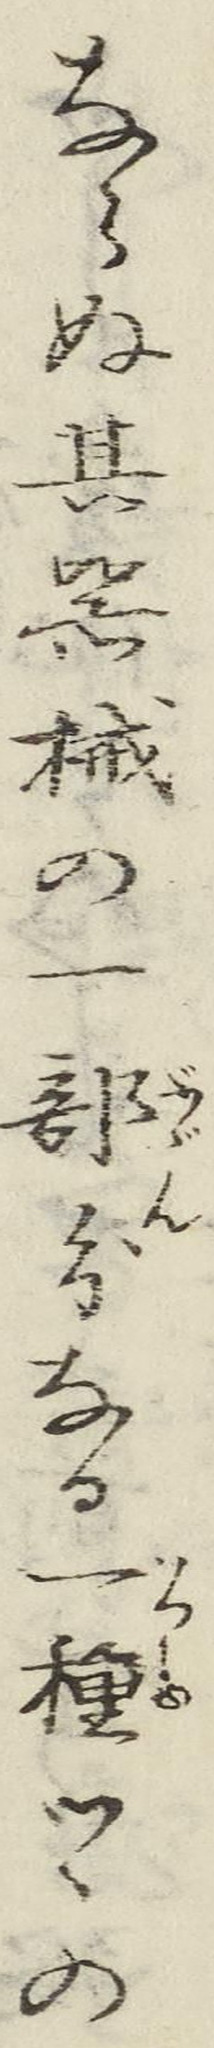ならぬ其器械の一部分なる一種ツヽの
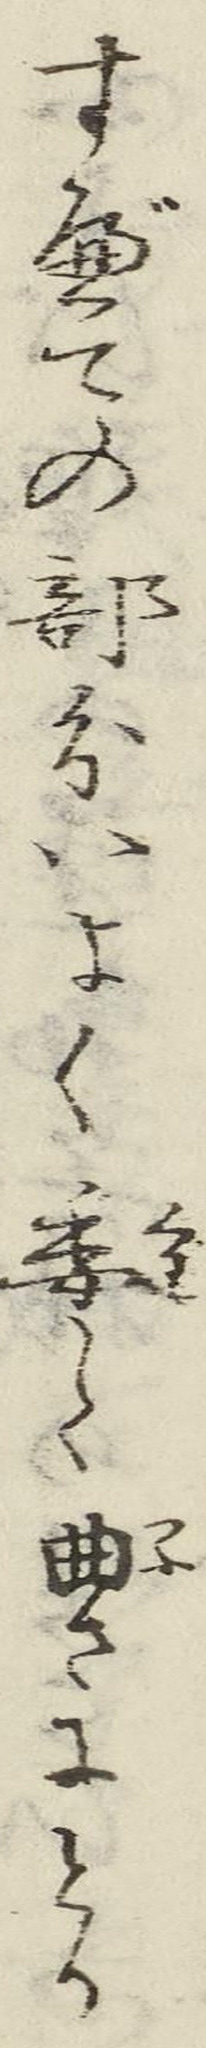すべての部分はよく委しく曲さにとり
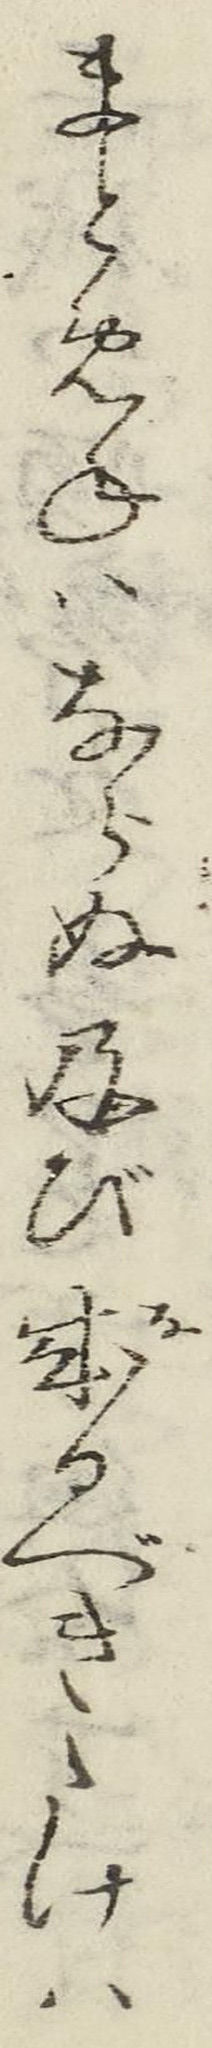まとめねはならぬ及び成るべきたけは
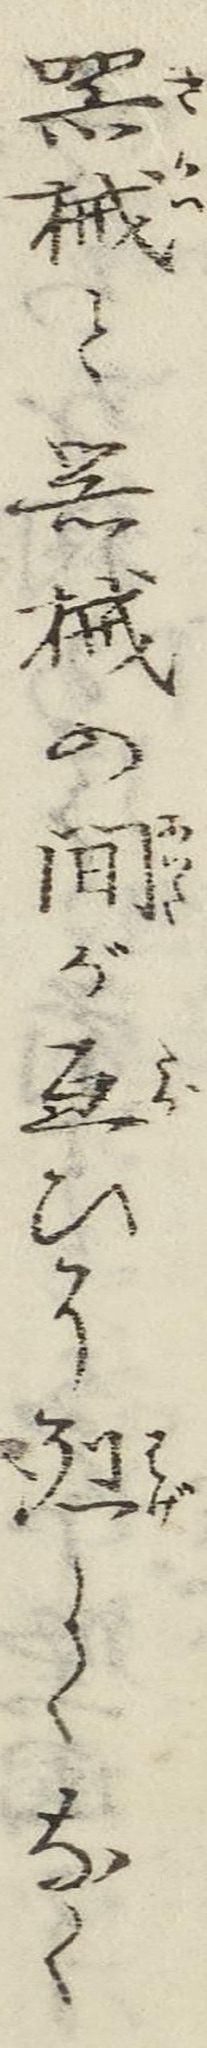器械と器械の間が互ひに烈しくなく
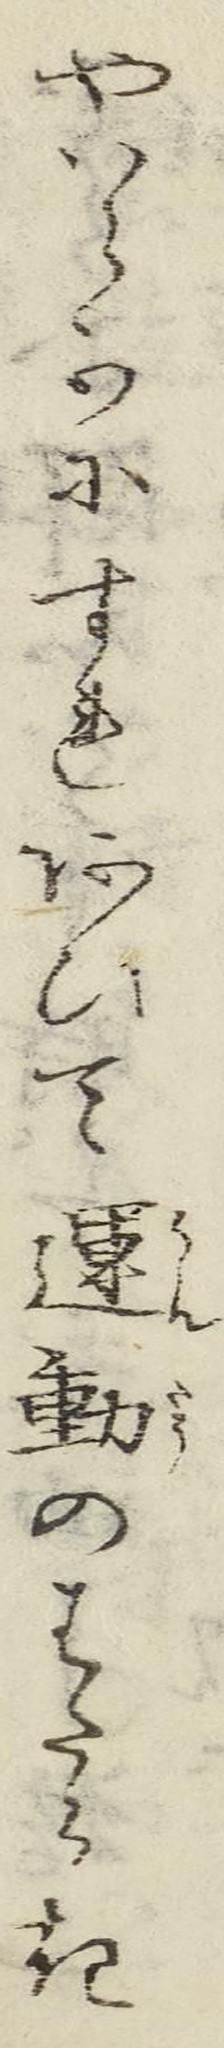やはらかにすれあひて運動のはたらき
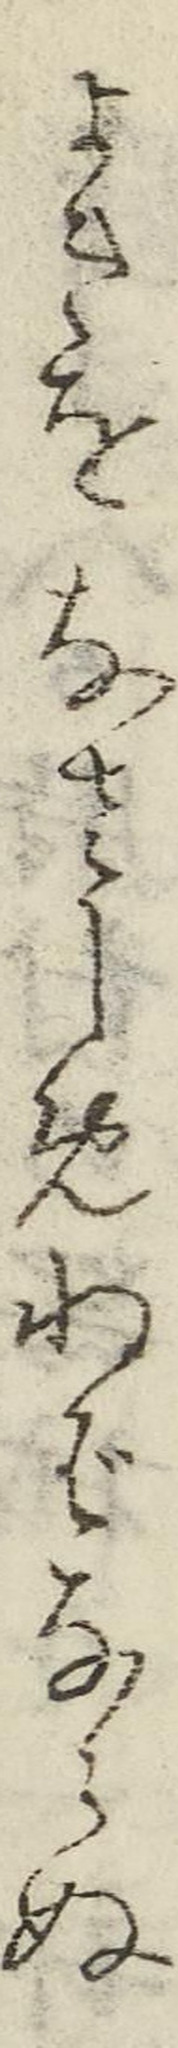よきをなさしめねばならぬ

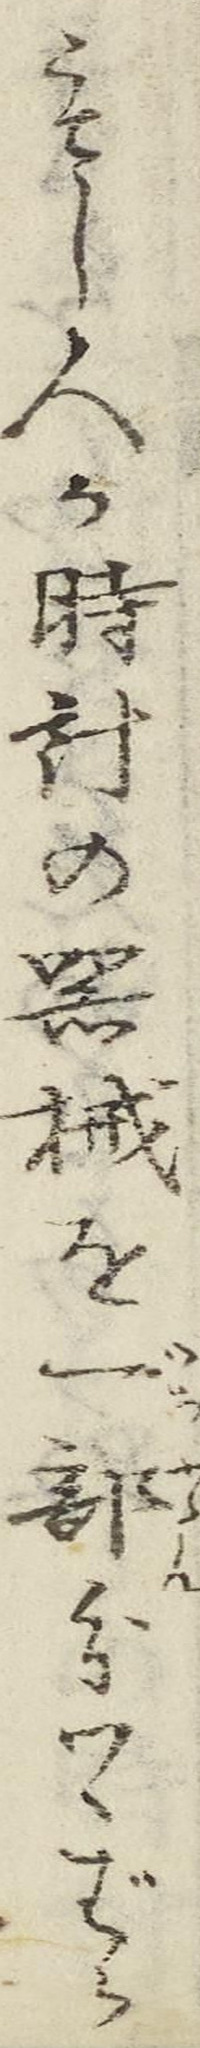もし人か時計の器械を一部分ツヽばら
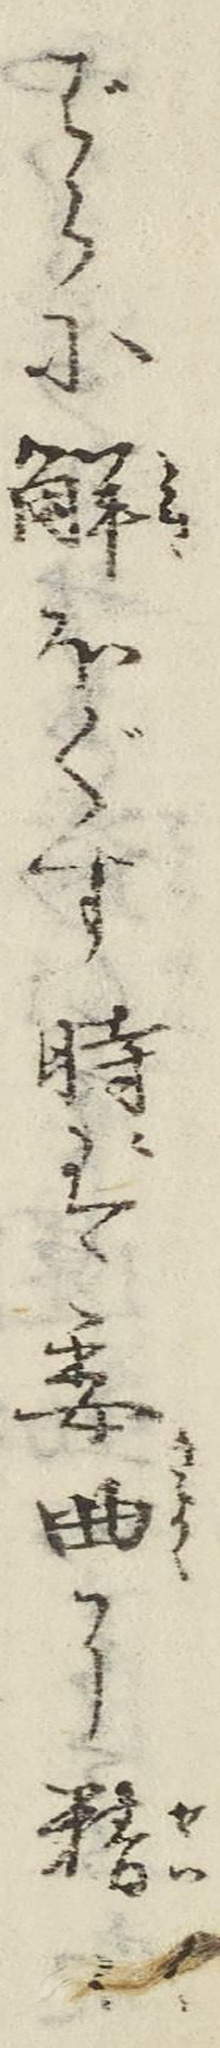ばらに解ほぐす時には委曲に精〻
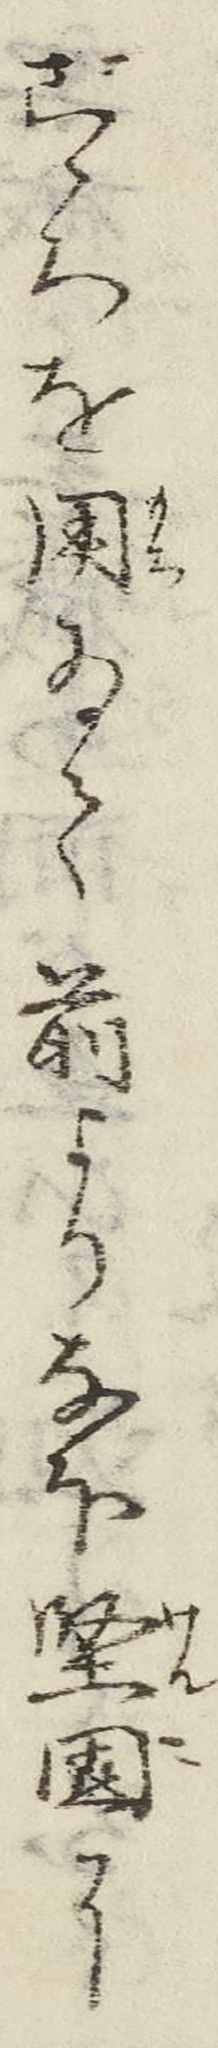こゝろを用ゐて前よりなほ堅固に
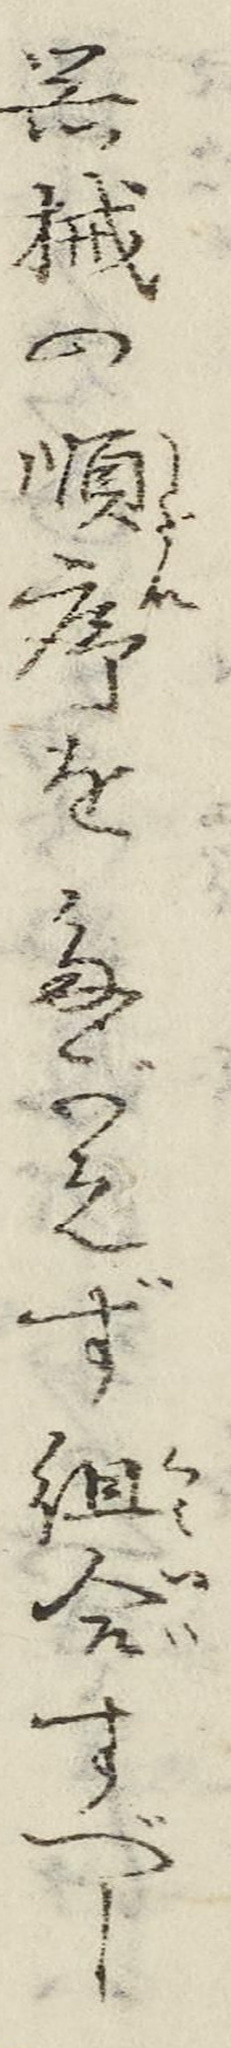器械の順序をたがえず組合すべし
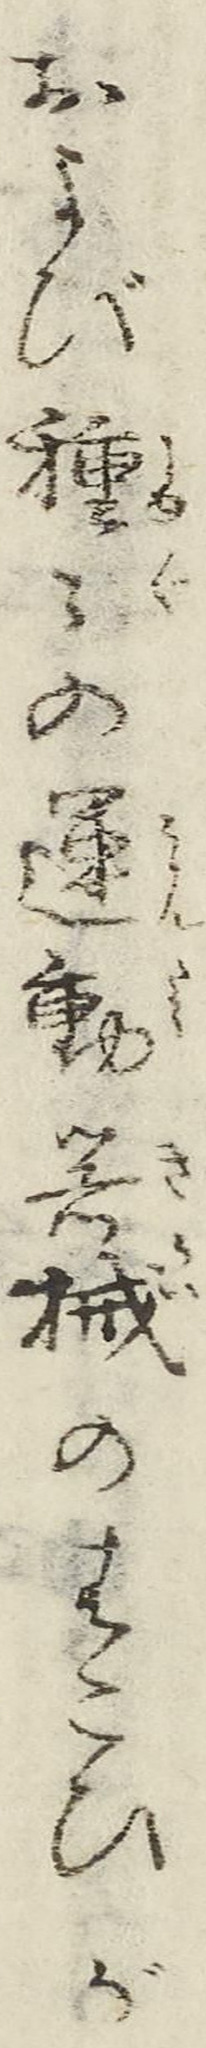および種〻の運動器械のはこひが
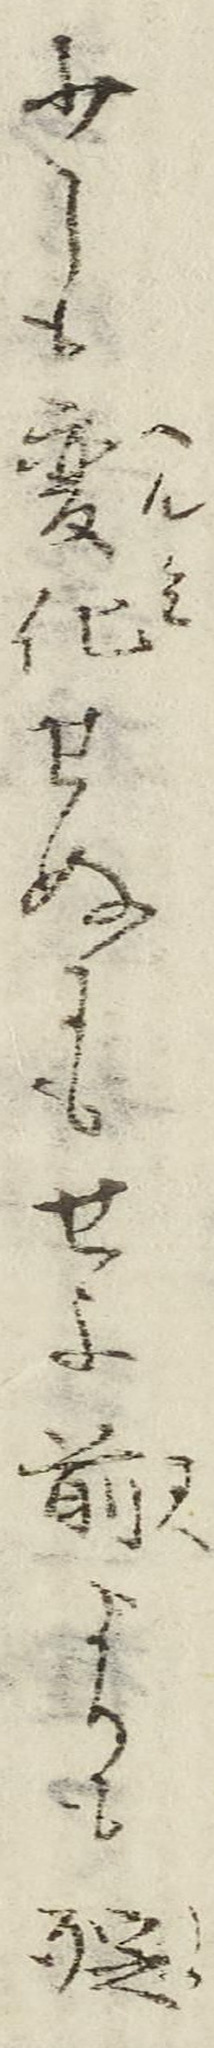少しも変化せぬにもせよ前よりも聢
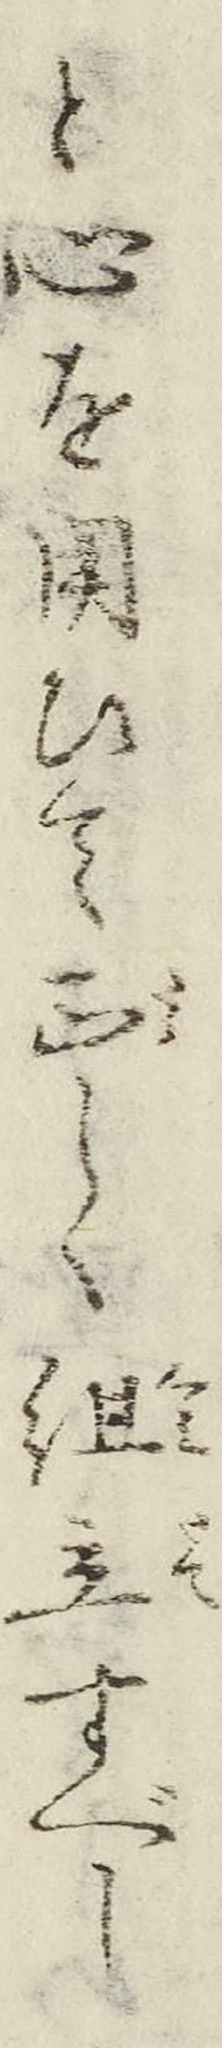と心を用ひて正しく組立すべし
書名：[時計に関する冊子]
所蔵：東京大学地震研究所図書室 Earthquake Research Institute Library, The University of Tokyo, JAPAN
